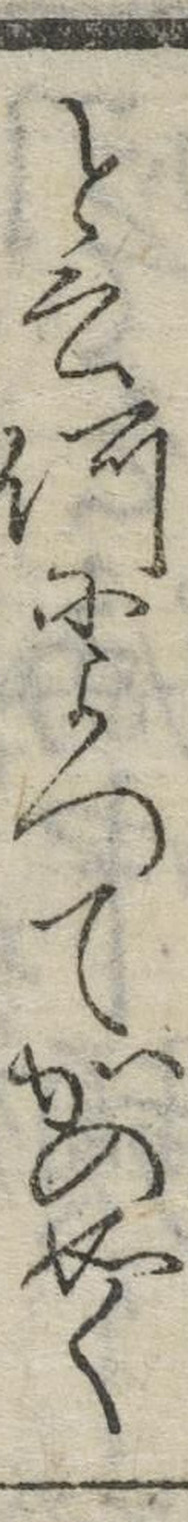と云何によつてかの如く
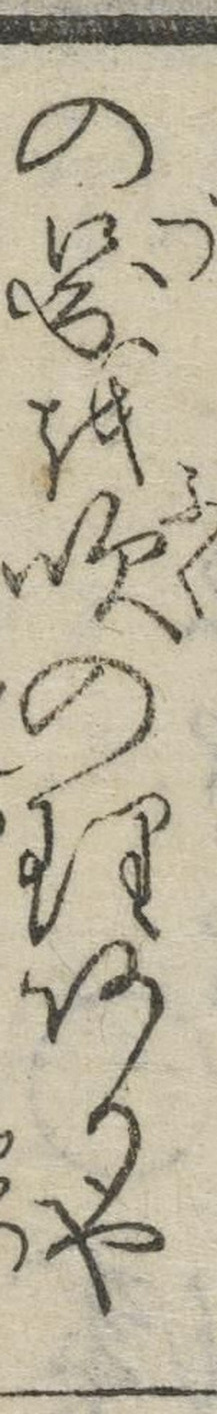の圖を吹の理ありや
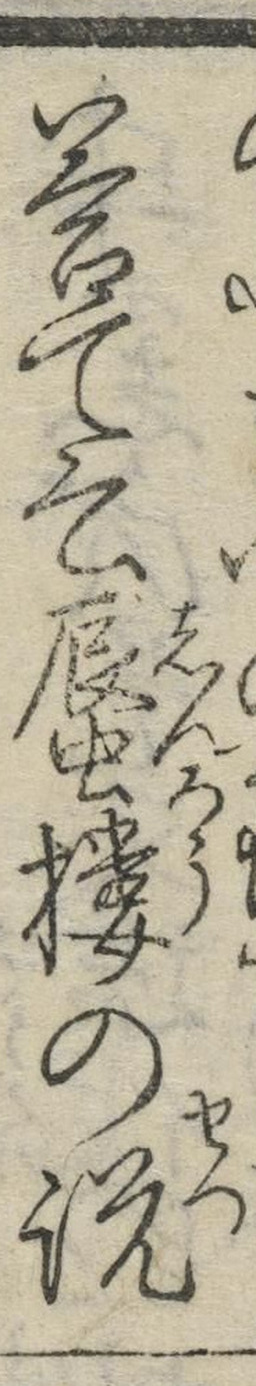答て云蜃樓の説
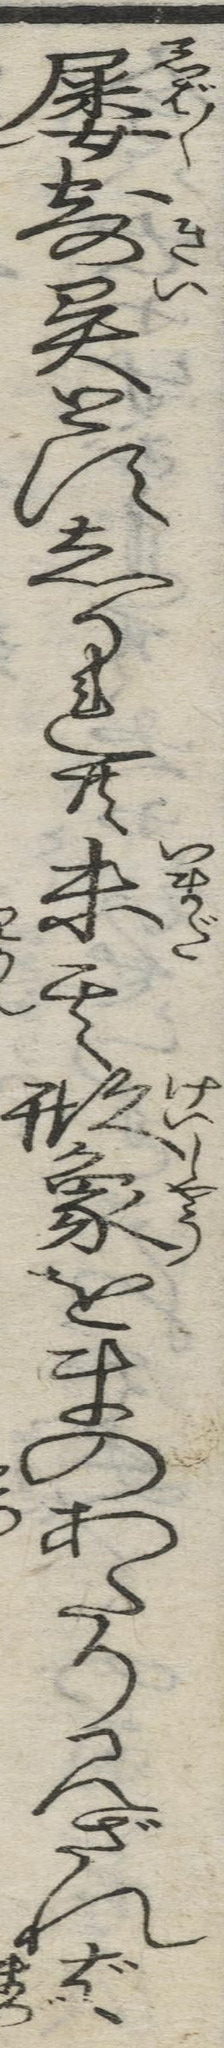屡奇異とすしかれども未其形象をまのあたり見ざれば
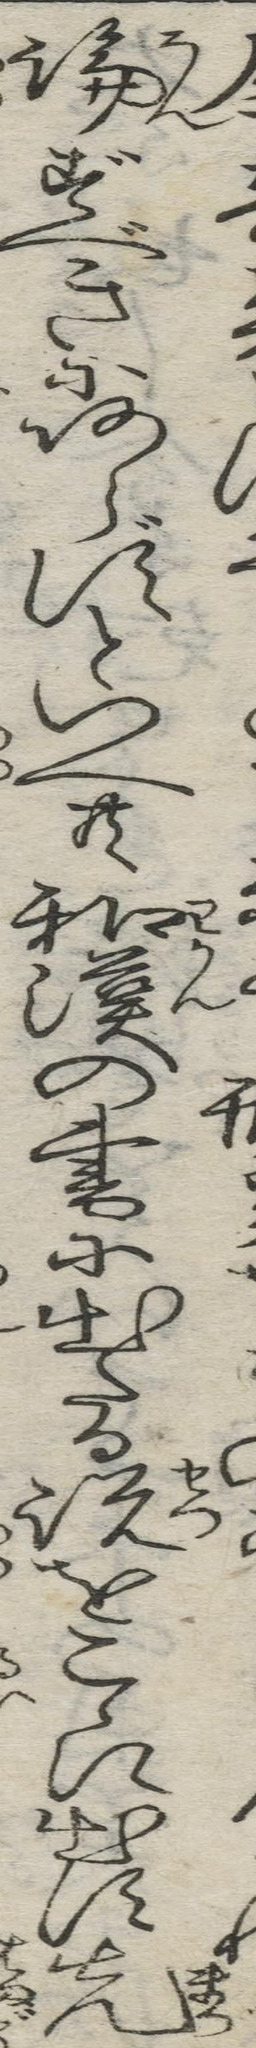論ずべきにあらずといへども和漢の書に出る説をこゝに出す先
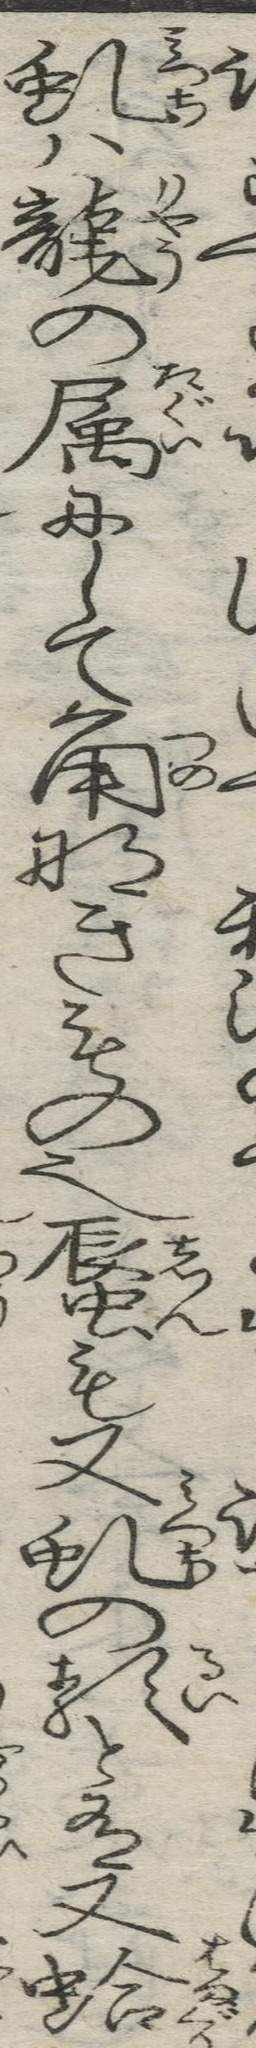虬は龍の属にして角なきもの也蜃も又虬の類と有又蛤
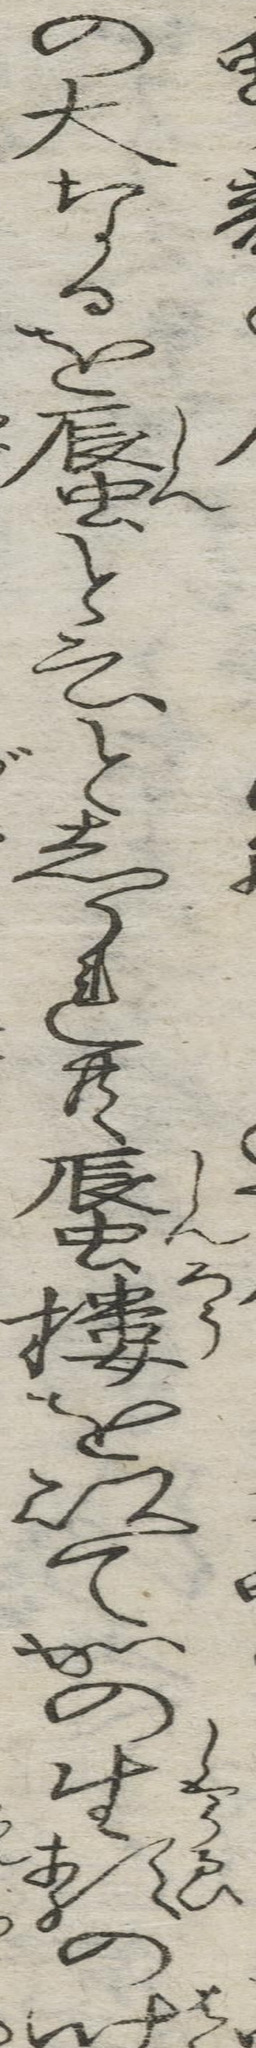の大なるを蜃と云としかれども蜃樓を以てかの生類の吐
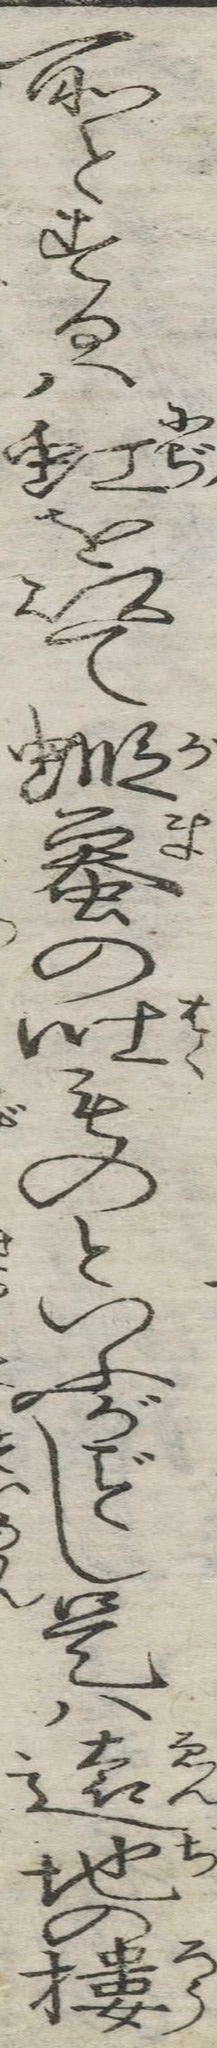所とするは虹を以て蝦蟇の吐ものといふがごとし是は遠地の樓
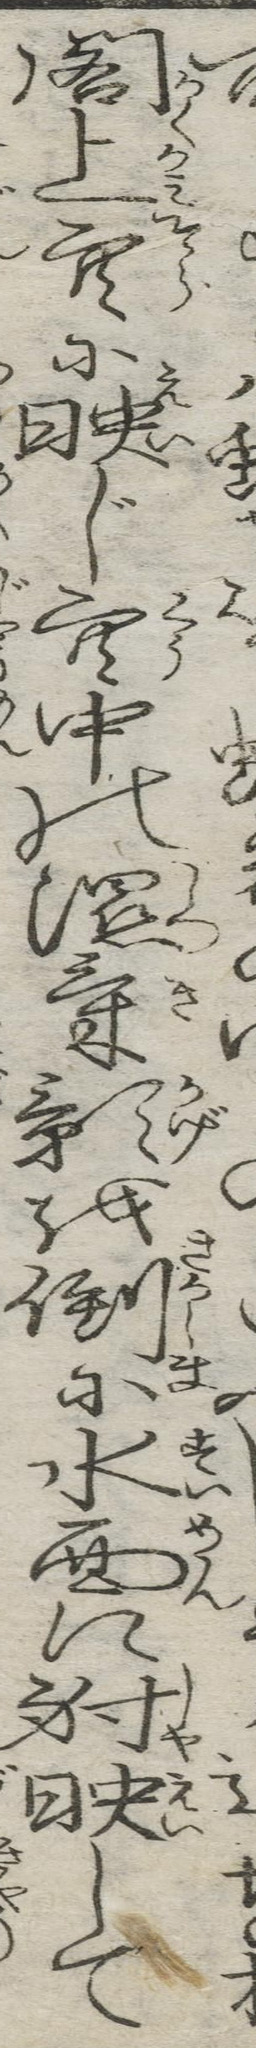閣上空に映じ空中の湿気影を倒に水面に射映して
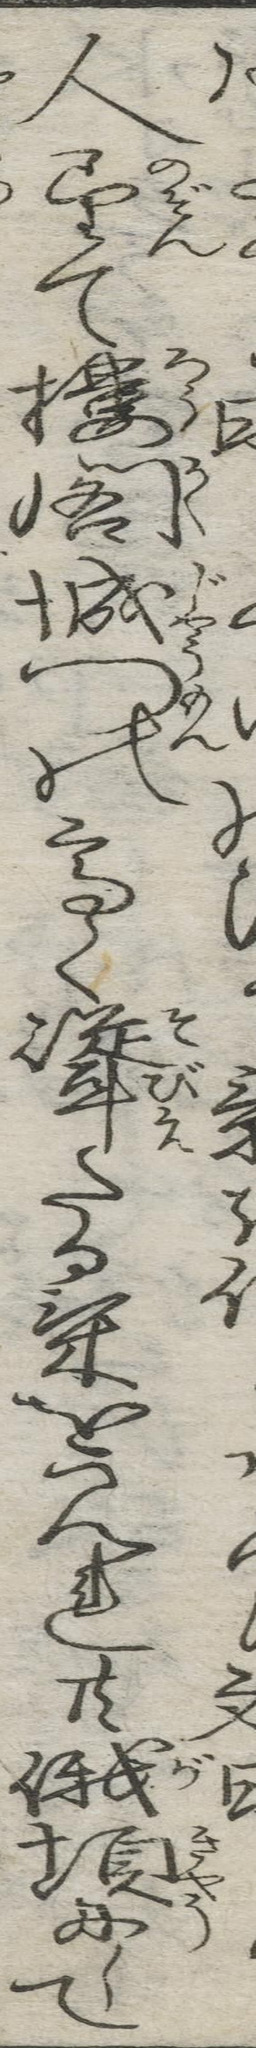人望て樓閣城門の高く聳たる気を見れども俄項にして
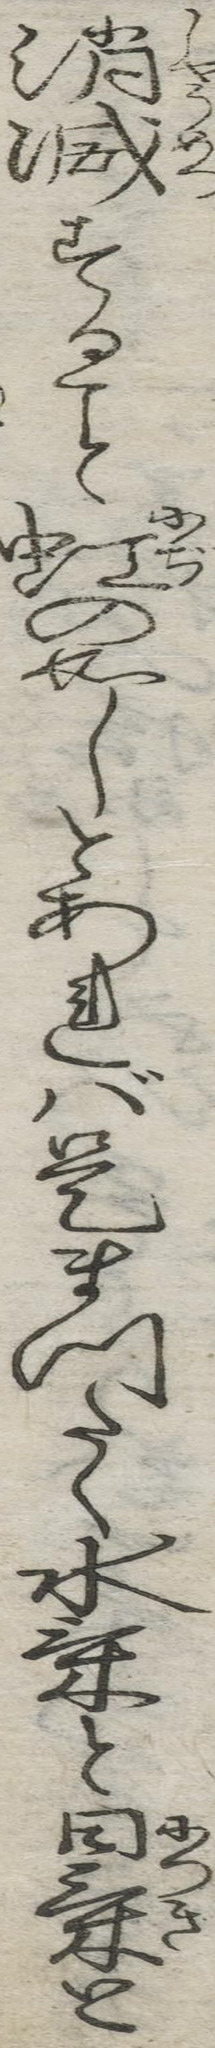消滅すること虹の如くとあれば是まつたく水気と日気と
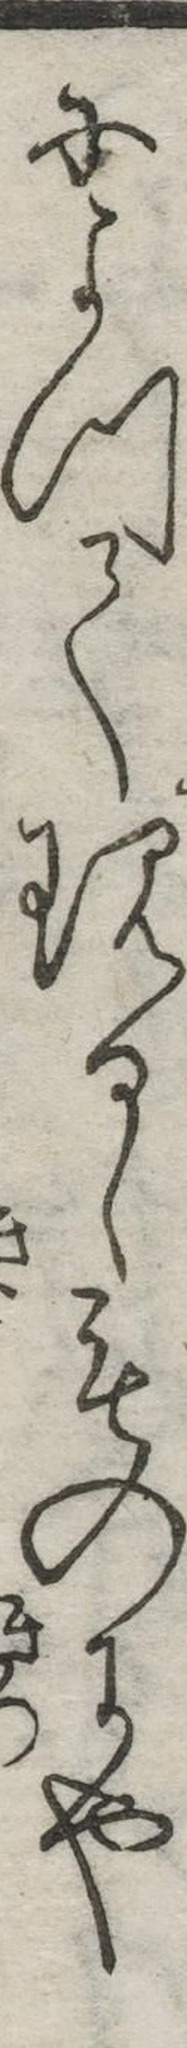によつて現るヽものにや
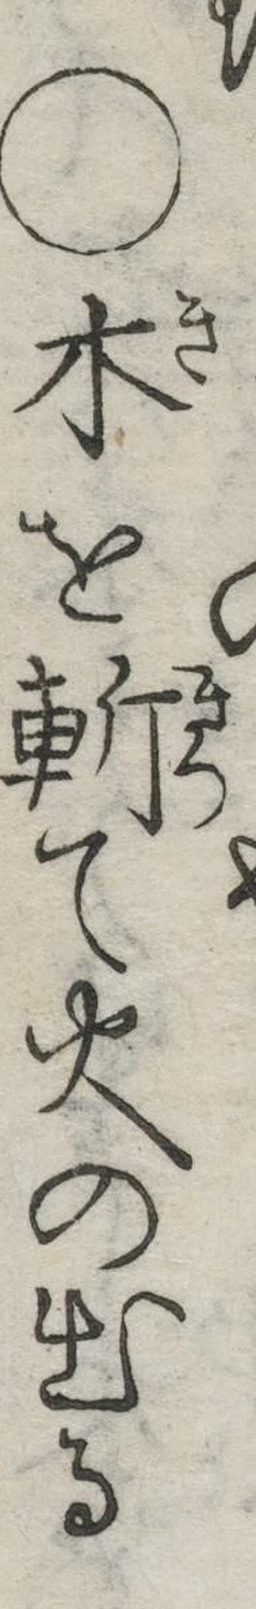○木を斬て火の出る
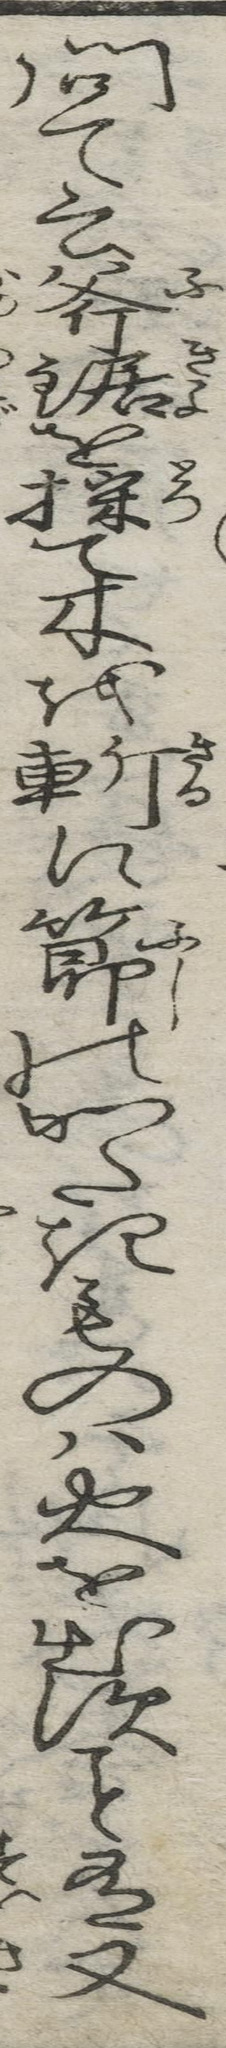問て云斧鋸を採て木を斬に節のかたきものは火を出吹こと有又
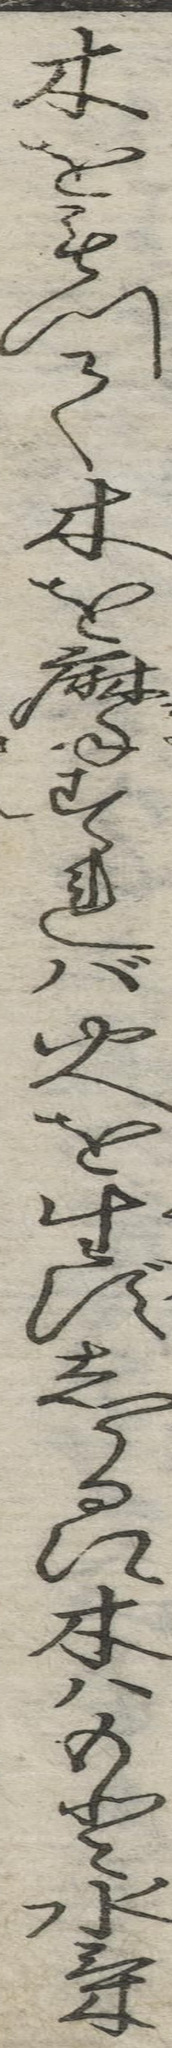木をもつて木を摩すれば火を生ずしかるに木はもと水気
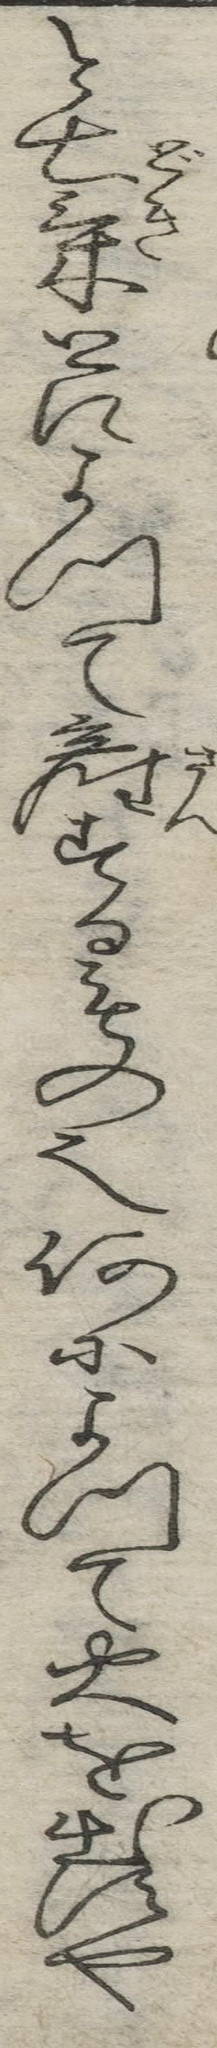と土気とによつて産するもの也何によつて火を出すや
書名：訓蒙天地辨　地
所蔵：東京大学地震研究所図書室 Earthquake Research Institute Library, The University of Tokyo, JAPAN
